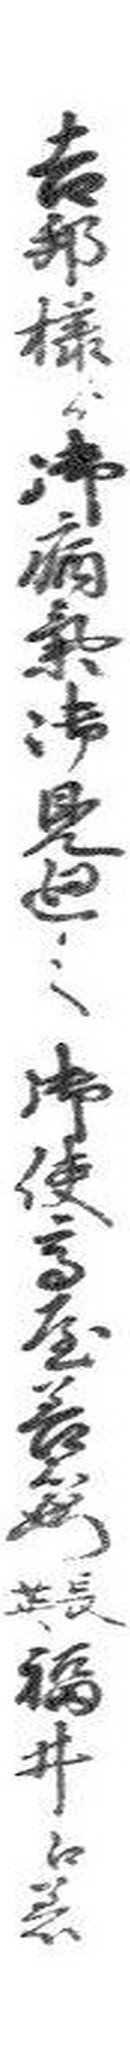吉邦様ゟ御病気御見廻之御使高屋善右衛門長英福井江着
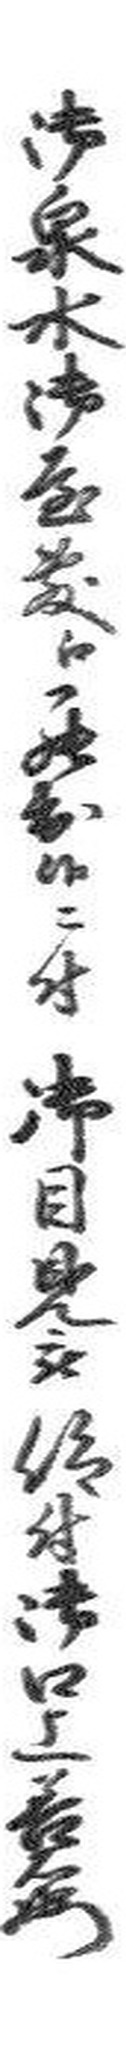御泉水御屋敷江罷出候ニ付御目見被仰付御口上善右衛門
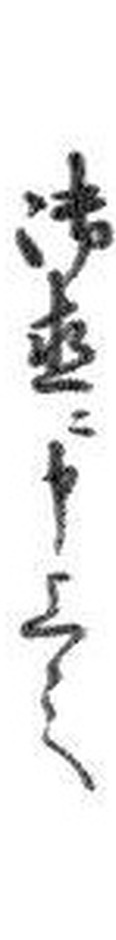御直ニ申上之
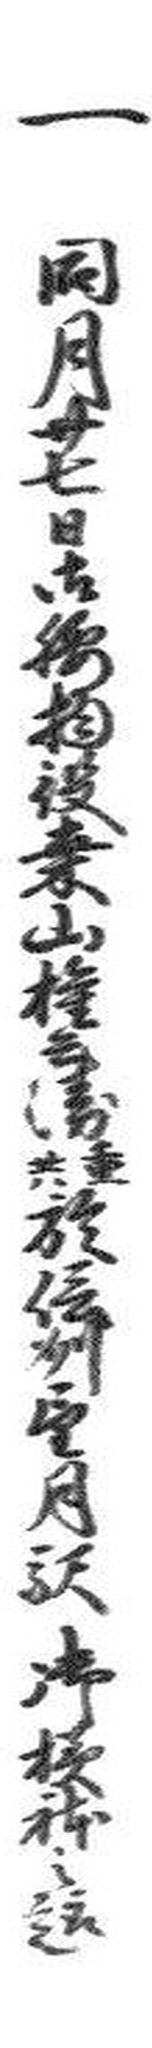一同月廿七日御腰物役桑山権兵衛重共於信州望月駅御様体之趣
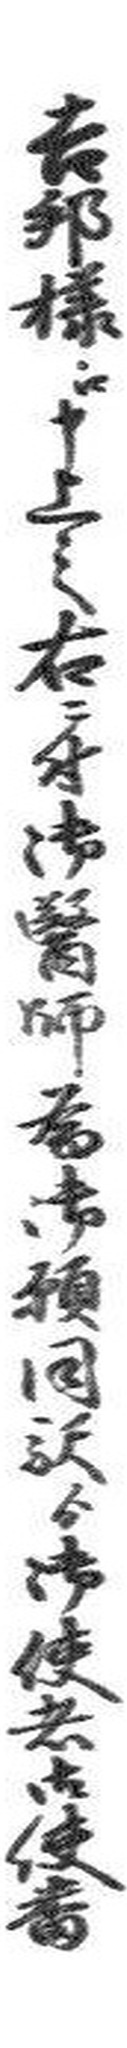吉邦様江申上之右ニ付御医師為御願同駅ゟ御使者御使番
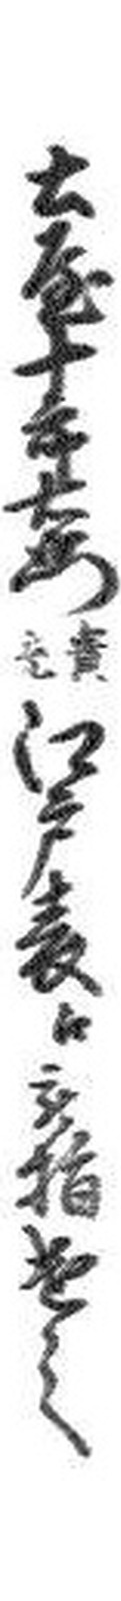土屋十郎右衛門貴充江戸表江被指遣之
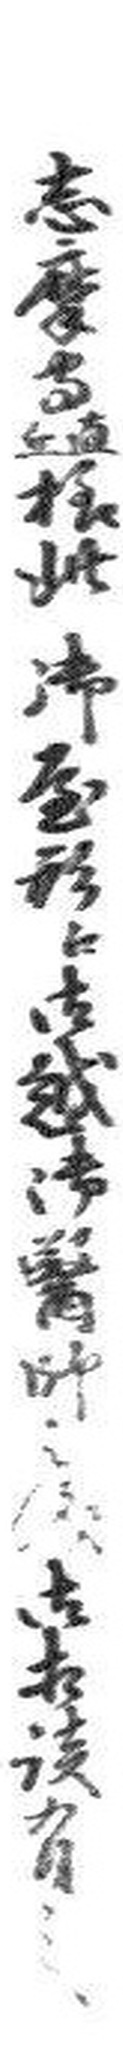志摩守直丘様此御屋敷江御越御医師之儀御相談有之
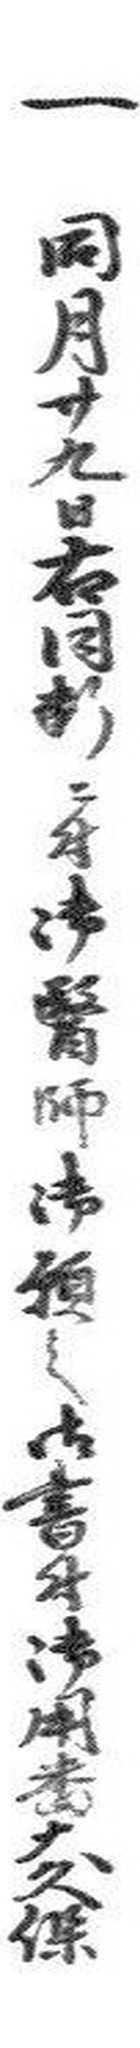一同月廿九日右同断ニ付御医師御願之御書付御用番大久保

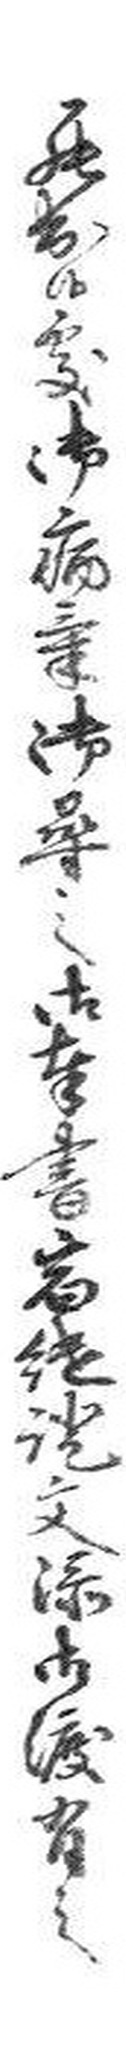罷出候処御病気御尋之御奉書宿継証文添御渡有之
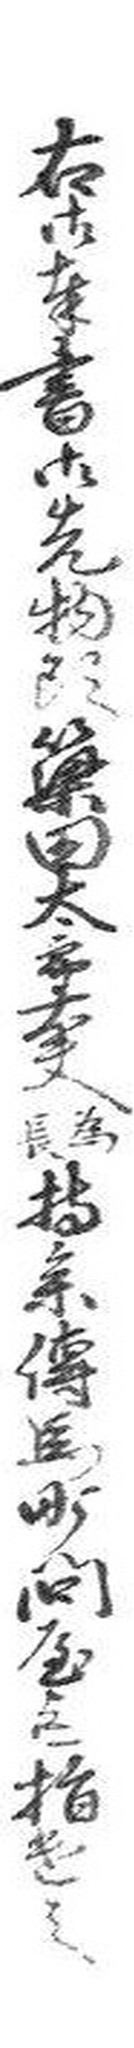右御奉書御先物頭簗田太郎大夫為長持参伝馬町問屋迄指遣之
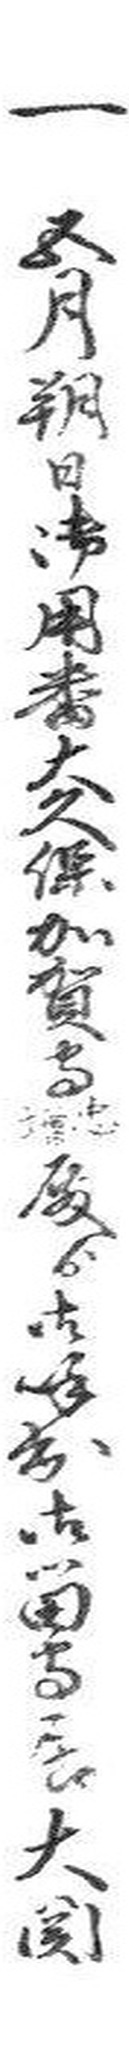一五月朔日御用番大久保加賀守忠増殿ゟ御呼出御留守居大関
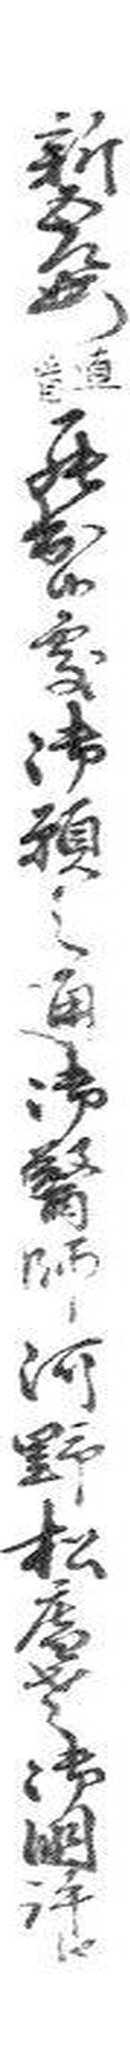新五左衛門直看罷出候処御願之通御医師河野松庵老御国許江
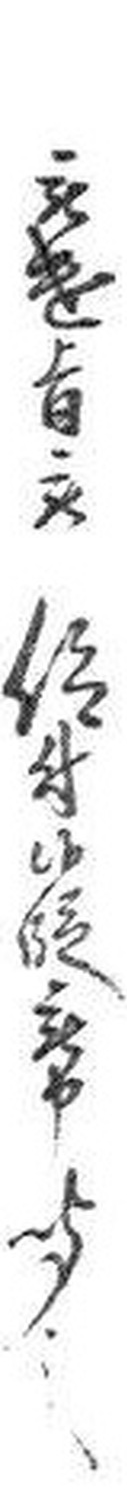被遣旨被仰付候段被申聞之
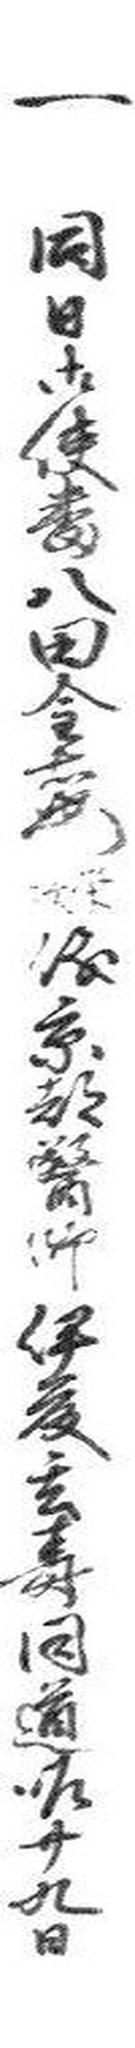一同日御使番八田金右衛門栄次儀京都医師伊藤玄寿同道昨廿九日
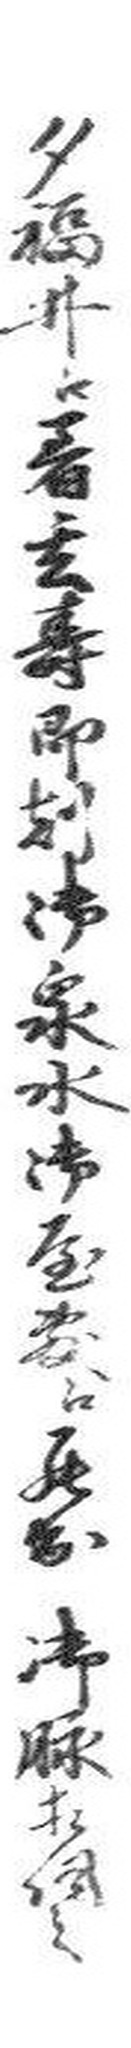夕福井江着玄寿即刻御泉水御屋敷江罷出御脈相伺之
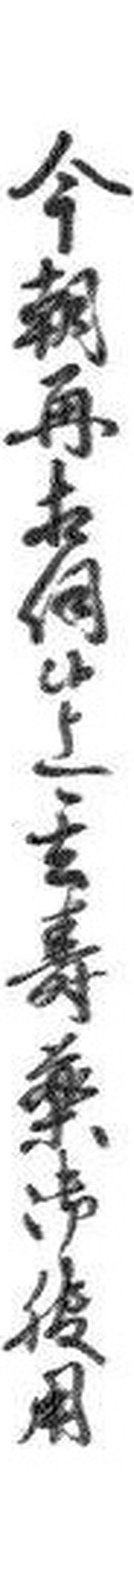今朝再相伺候上玄寿薬御服用
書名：家譜 二十六 吉品公 従宝永七年到正徳二年
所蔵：福井県文書館 Fukui Prefectural Archives
